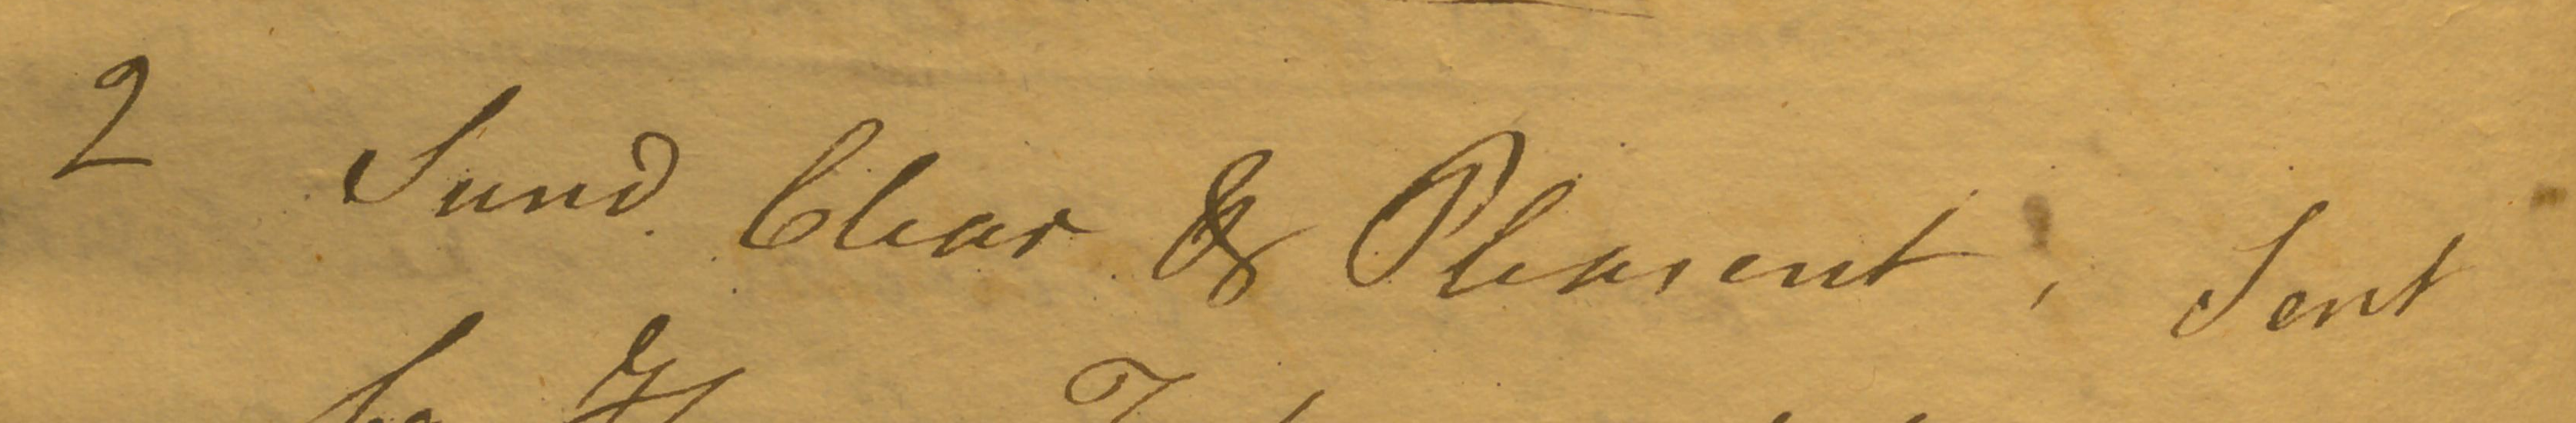2 Sund Clear & Pleasent. Sent
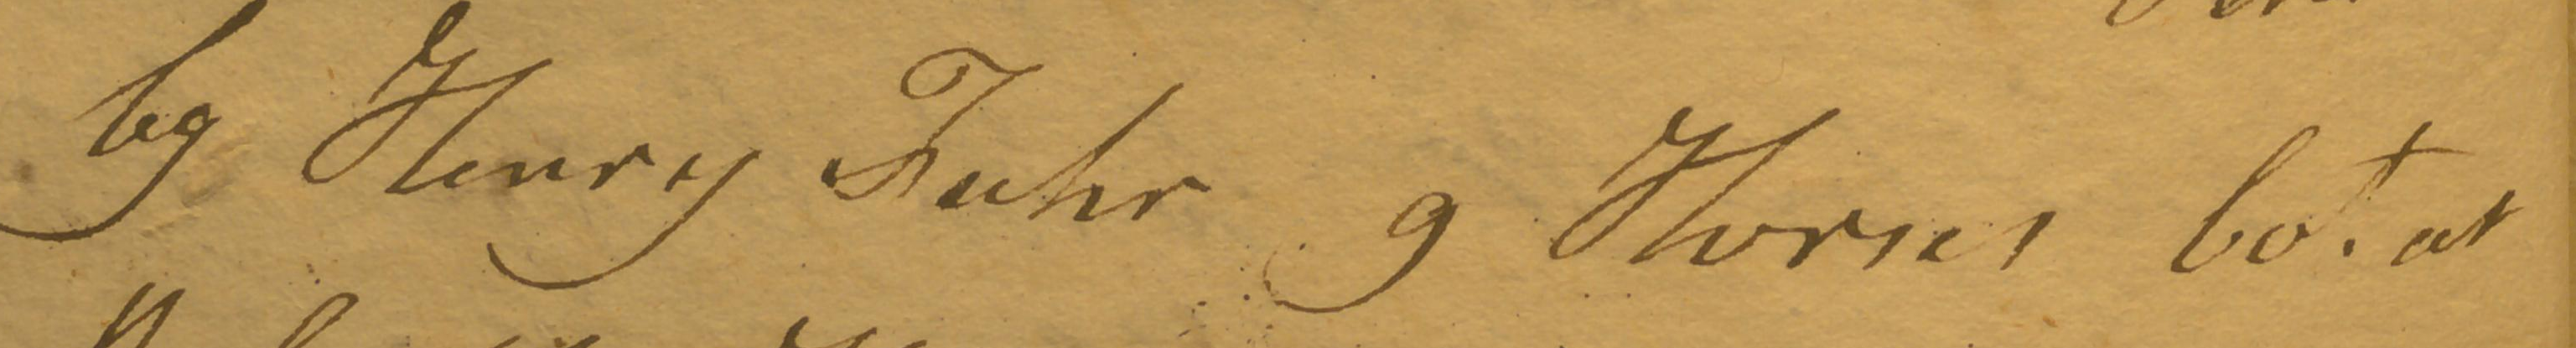by Henry Fuhr 9 Horses bo^t. at
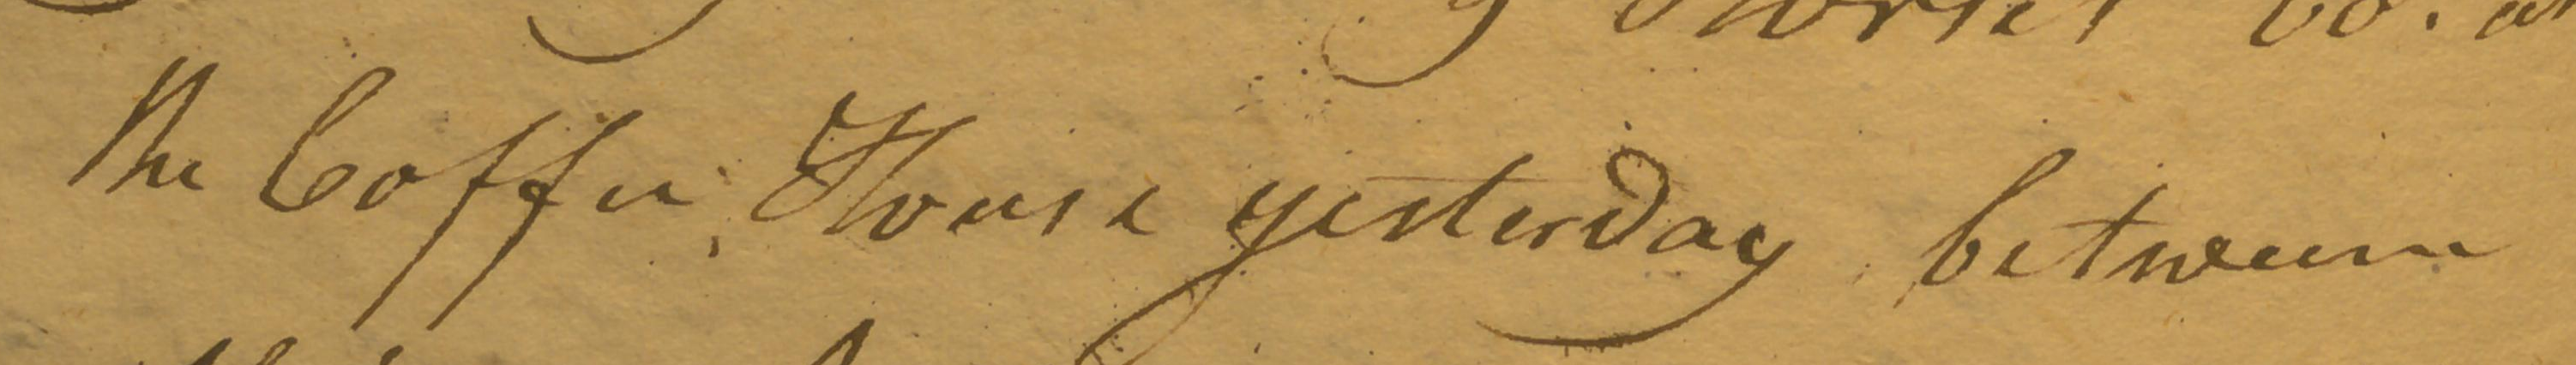the Coffer House yesterday between
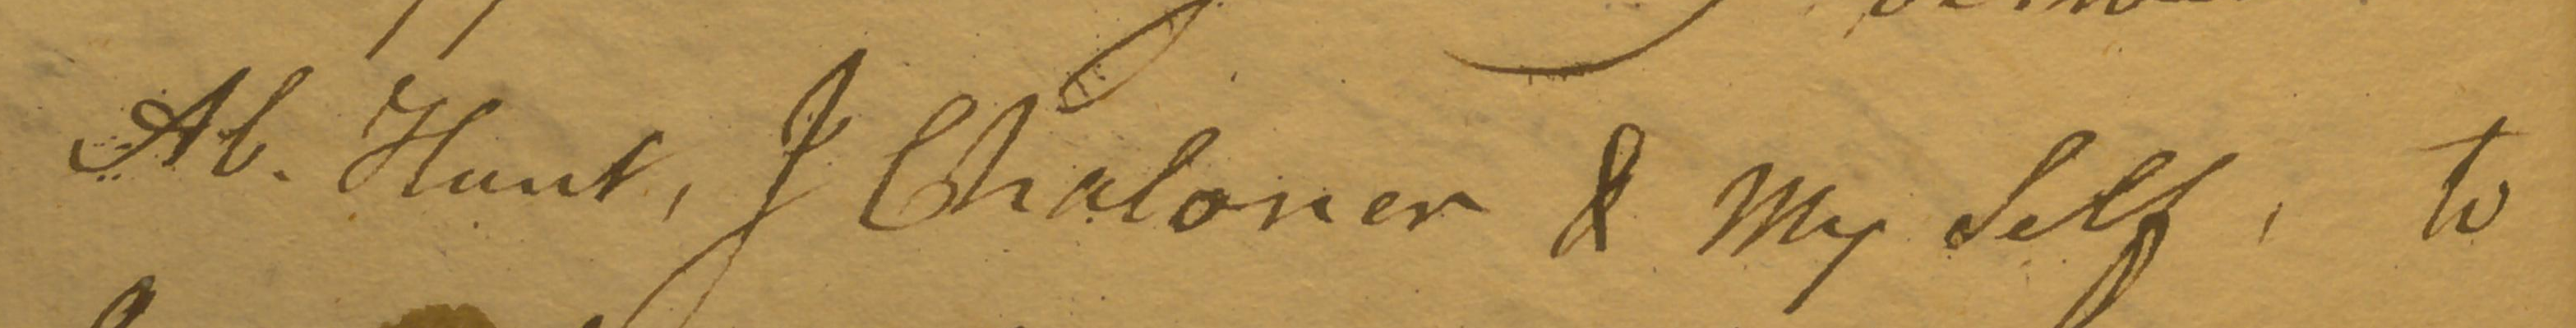Ab. Hunt, J Chaloner & My Self, to
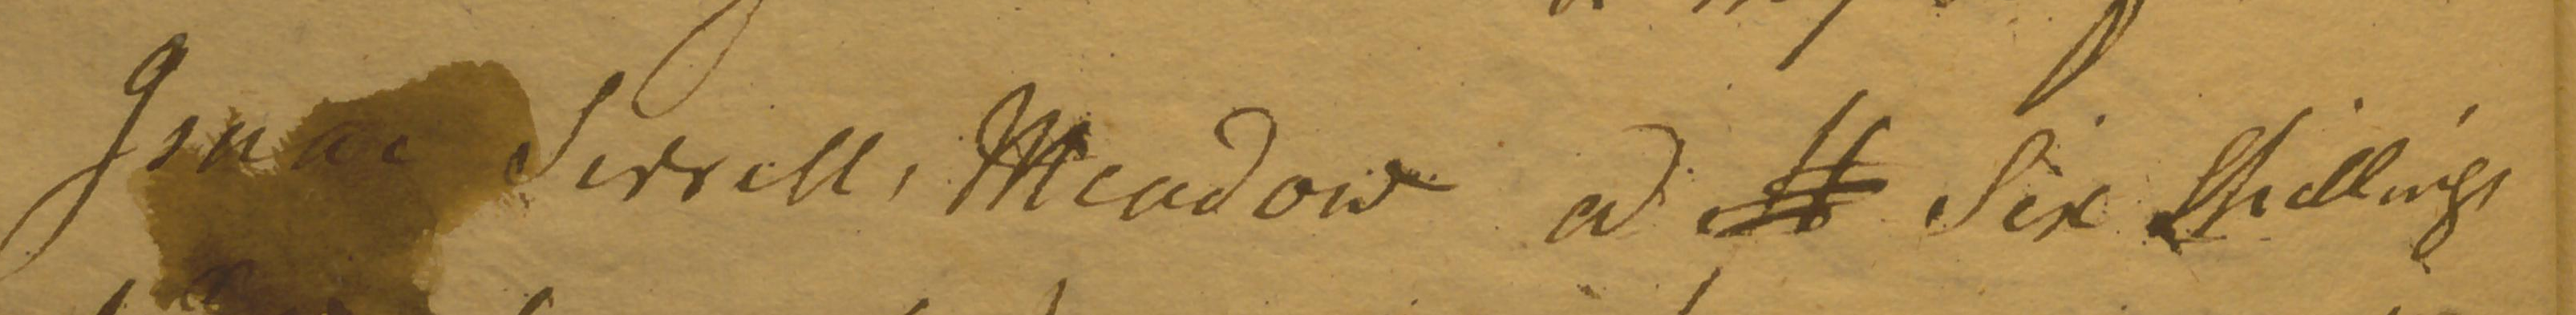Isaac Serrells Meadow @ [£6] Six shillings
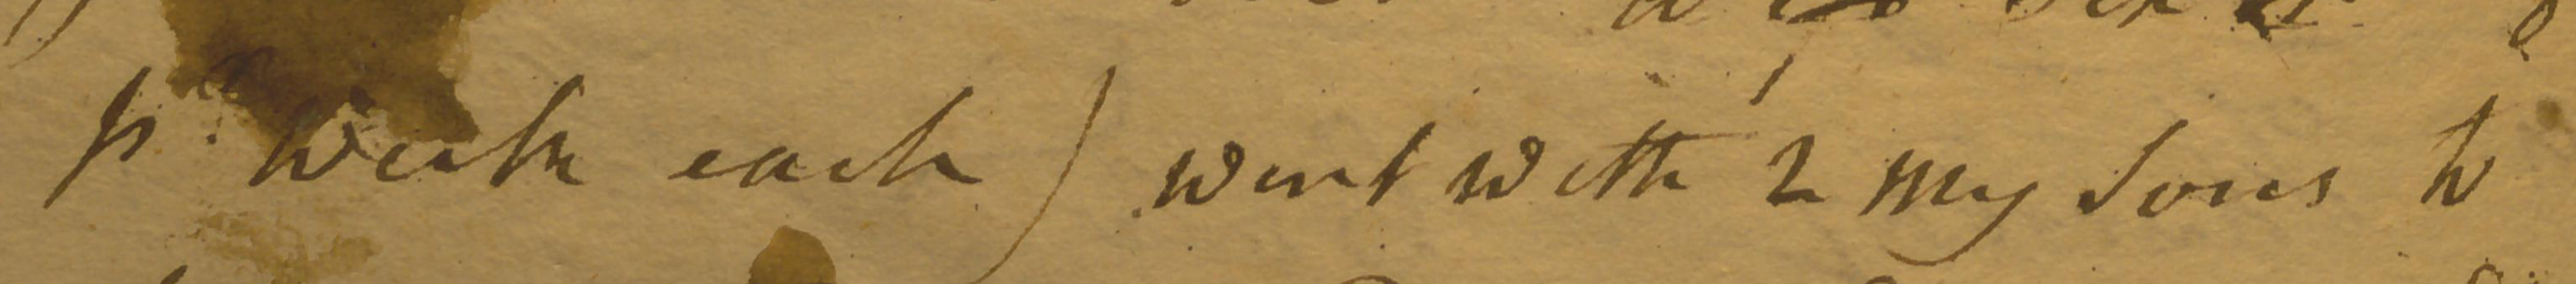p^r. week each) went with 2 My Sons to
